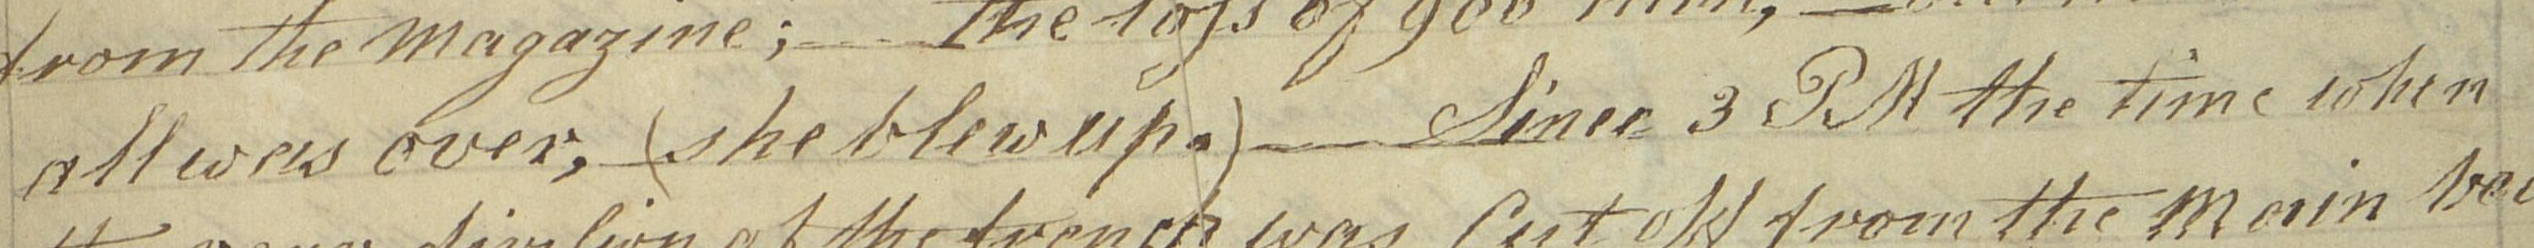all was over, (she blew up.) Since 3 PM the time when
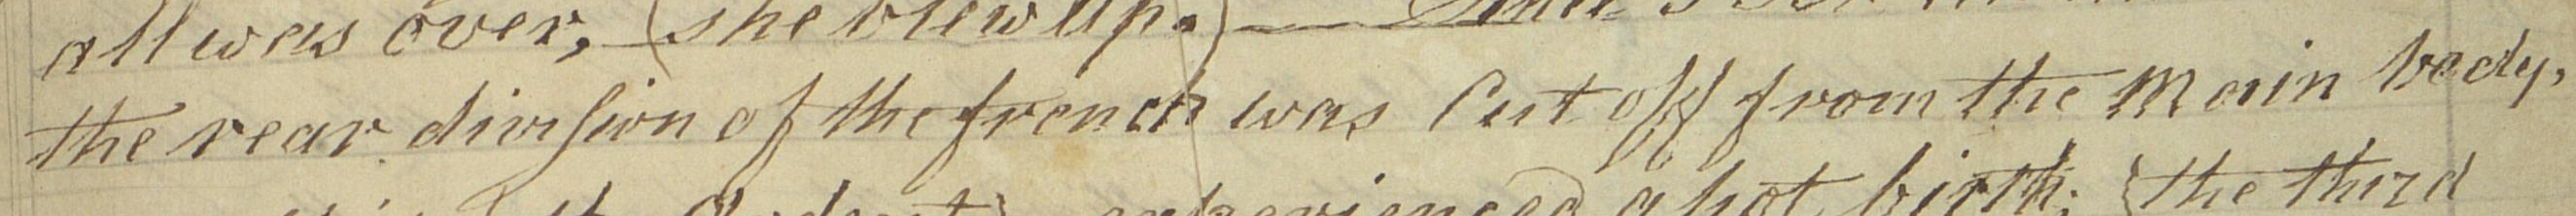the rear division of the french was cut off from the Main body
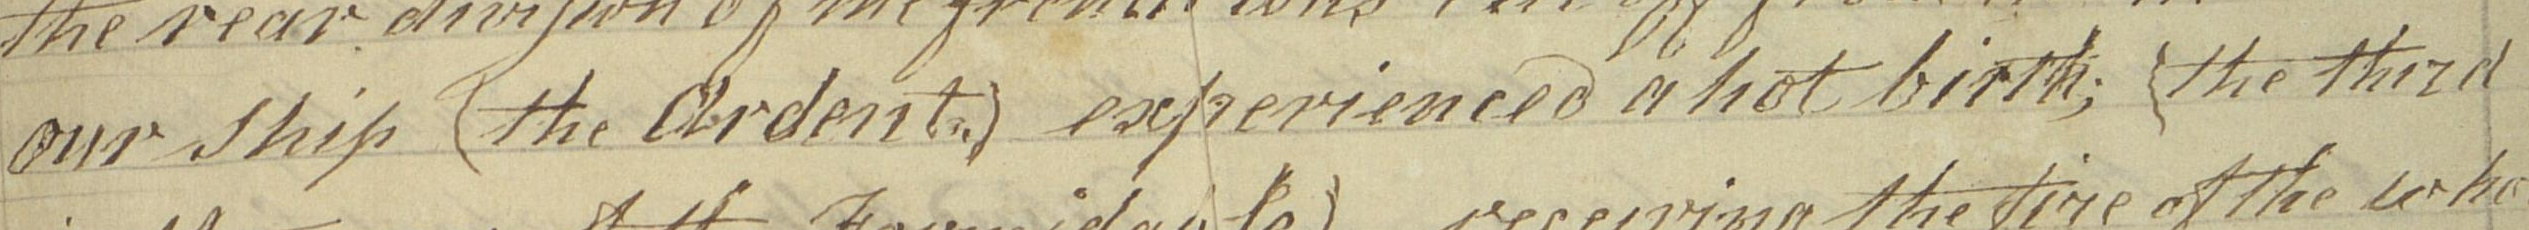our ship (the Ardent) experienced a hot birth; (the third
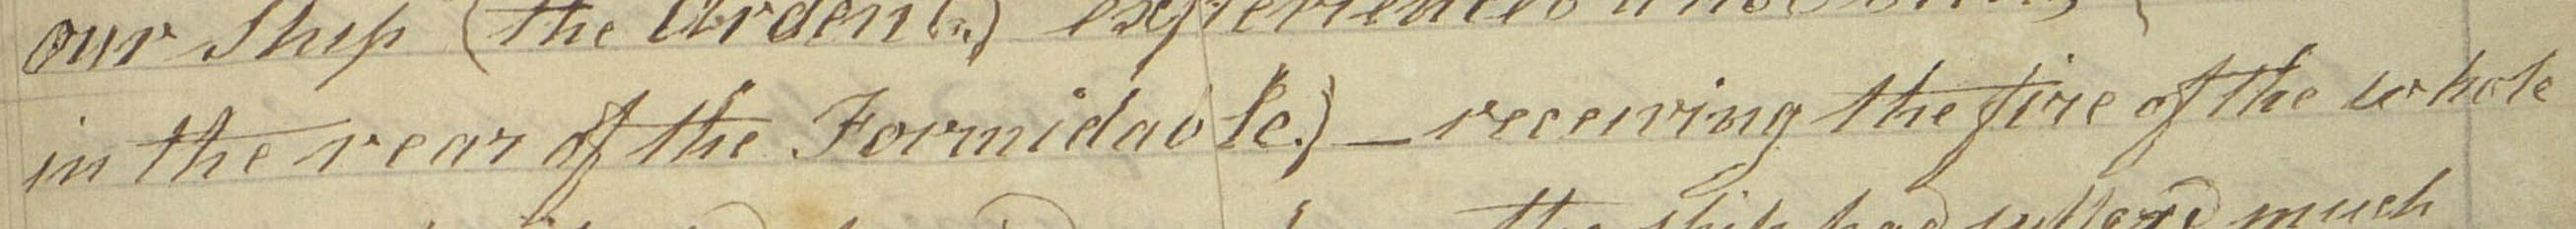in the rear of the Formidable.) receiving the fire of the Whole
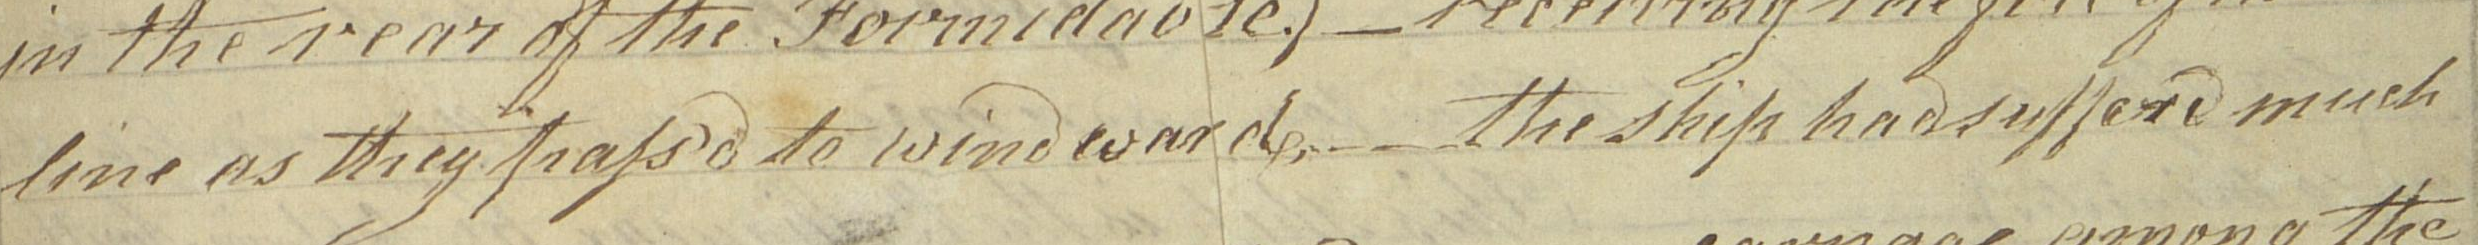line as they pass'd to windward, the ship had sufferd much
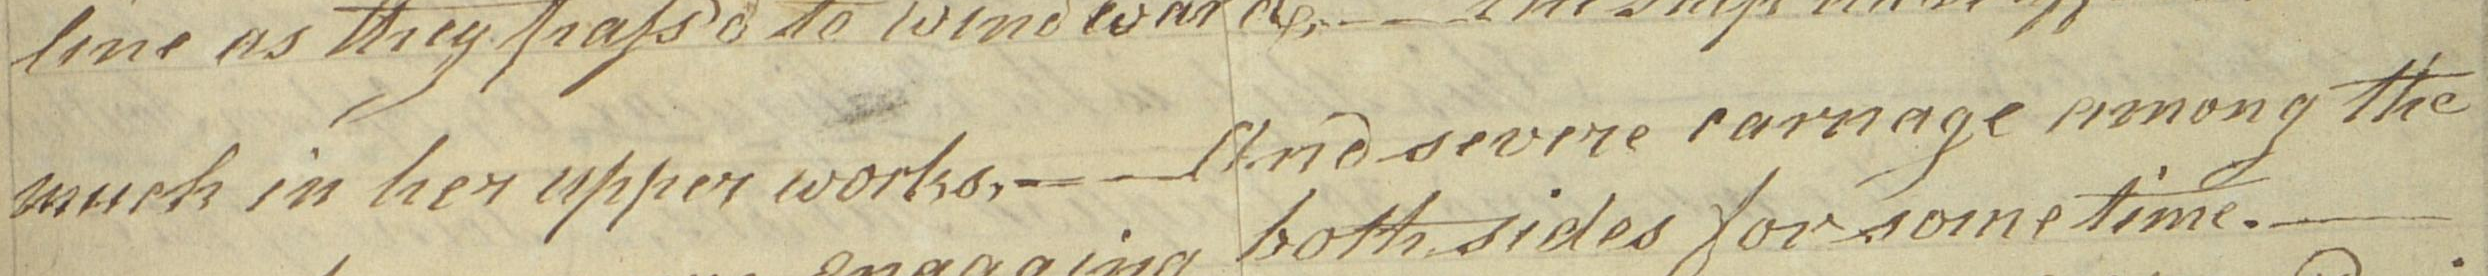much in her upper works, And severe carnage among the
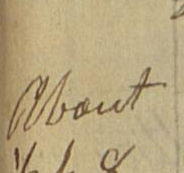About
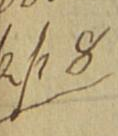1/2 / 8
